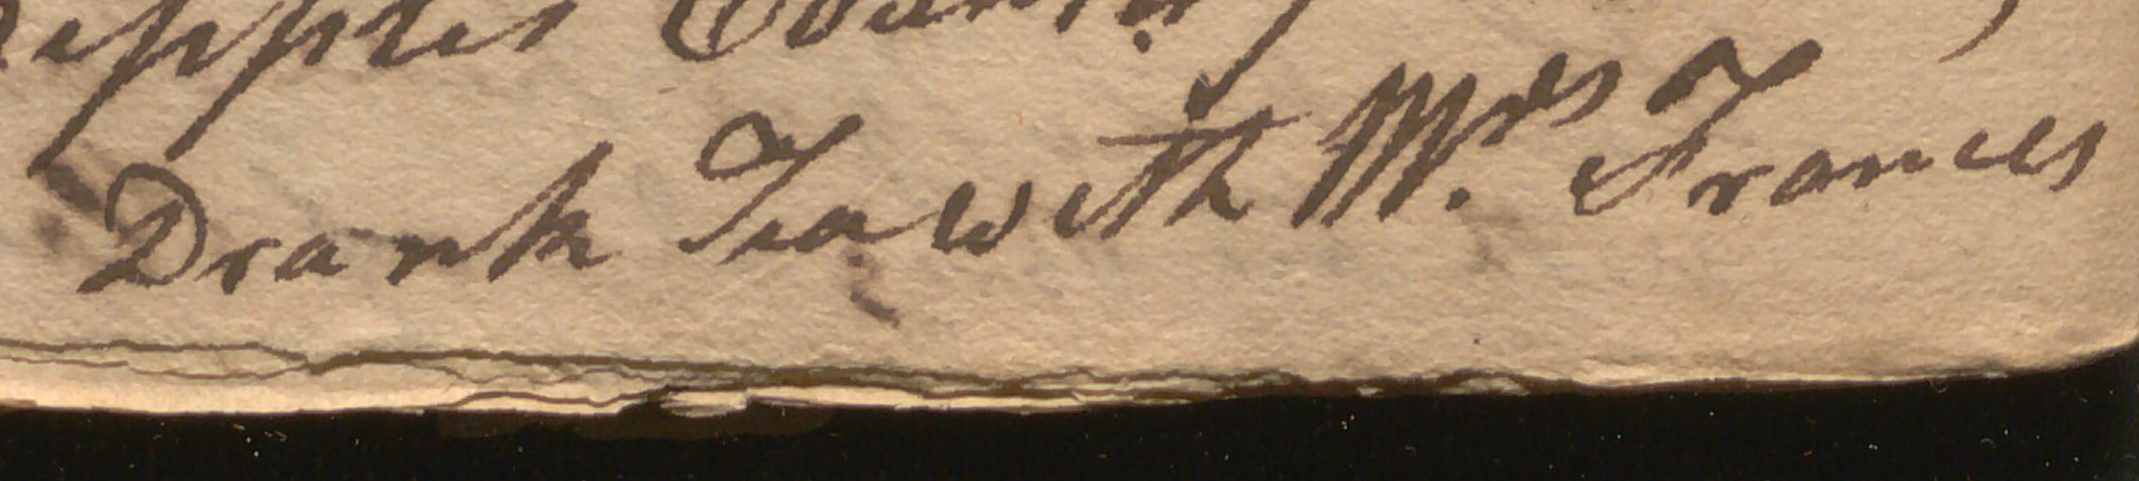Drank Tea with M^r. Frances
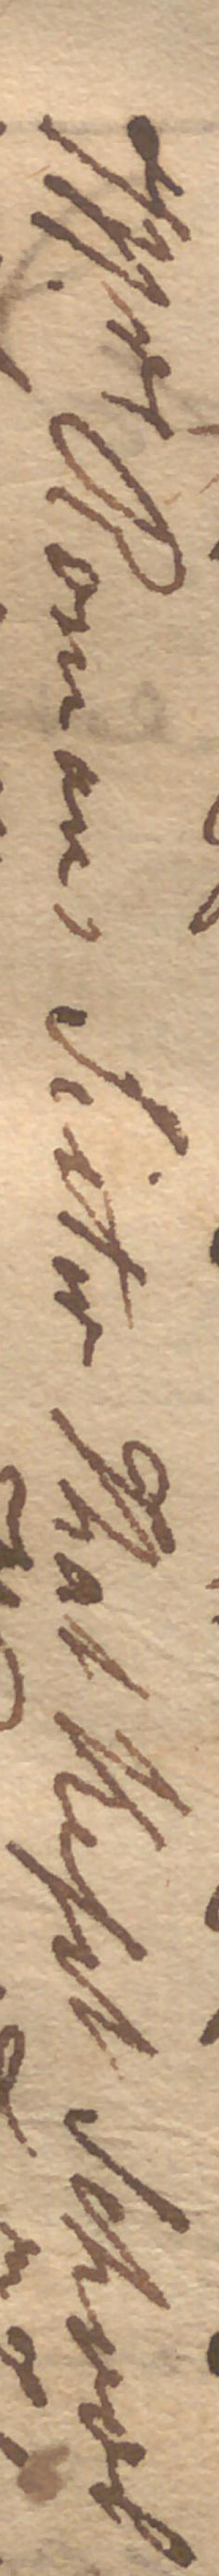M^rs. Romans Sister That Kept School
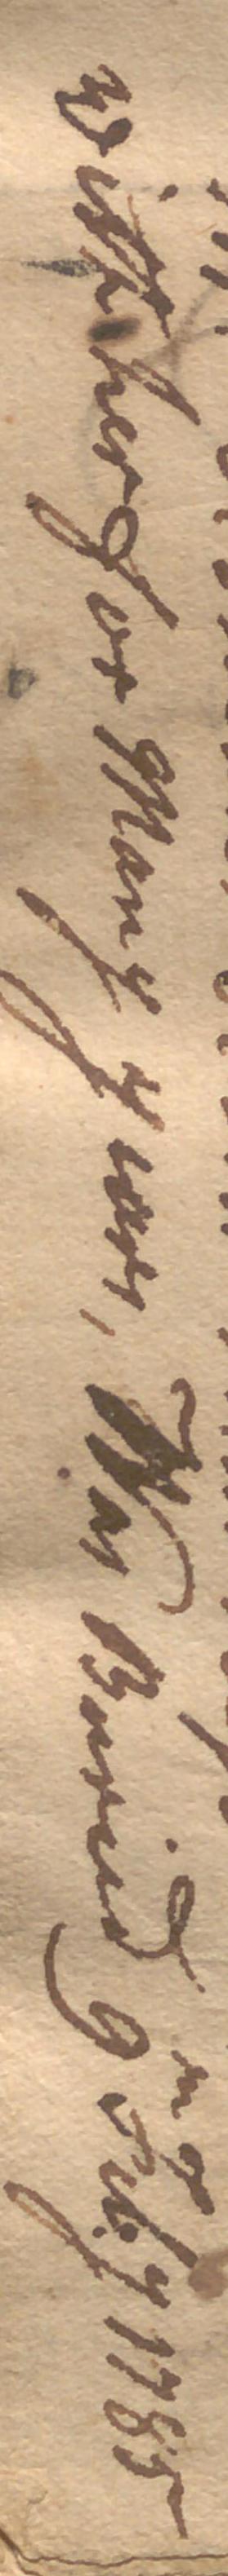with her for Many years, Has Buried 9th Feb^y. 1785
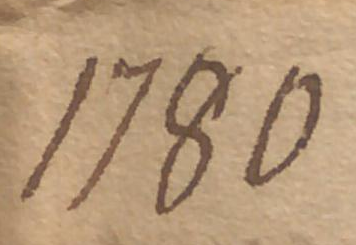1780
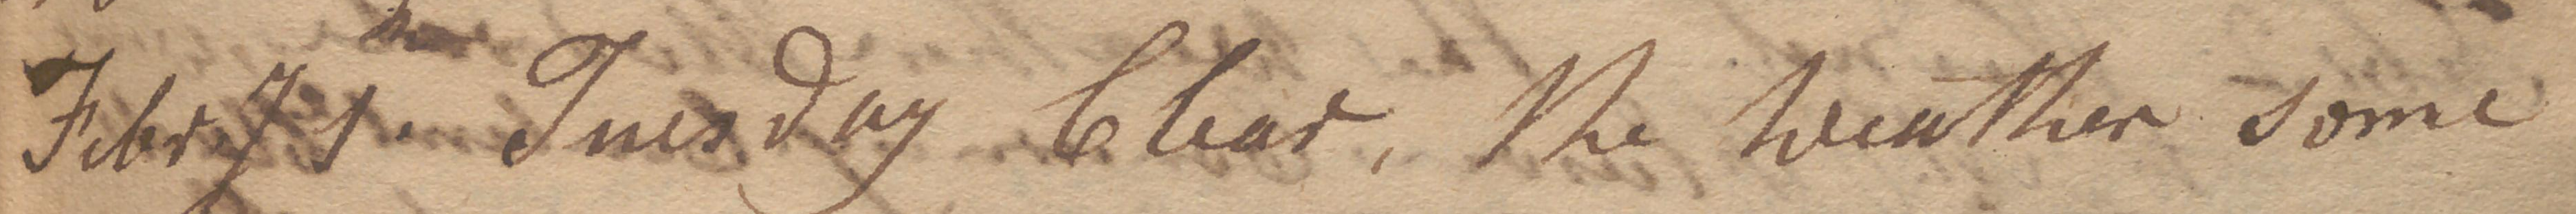Febr^y Tuesday Clear, the Weather some
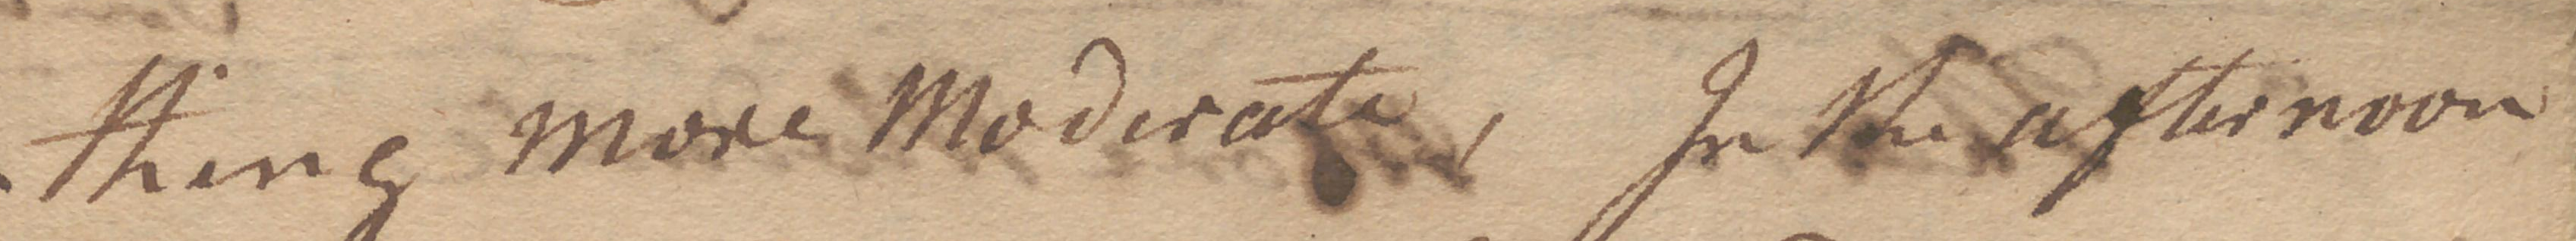thing more Moderate In the afternoon
